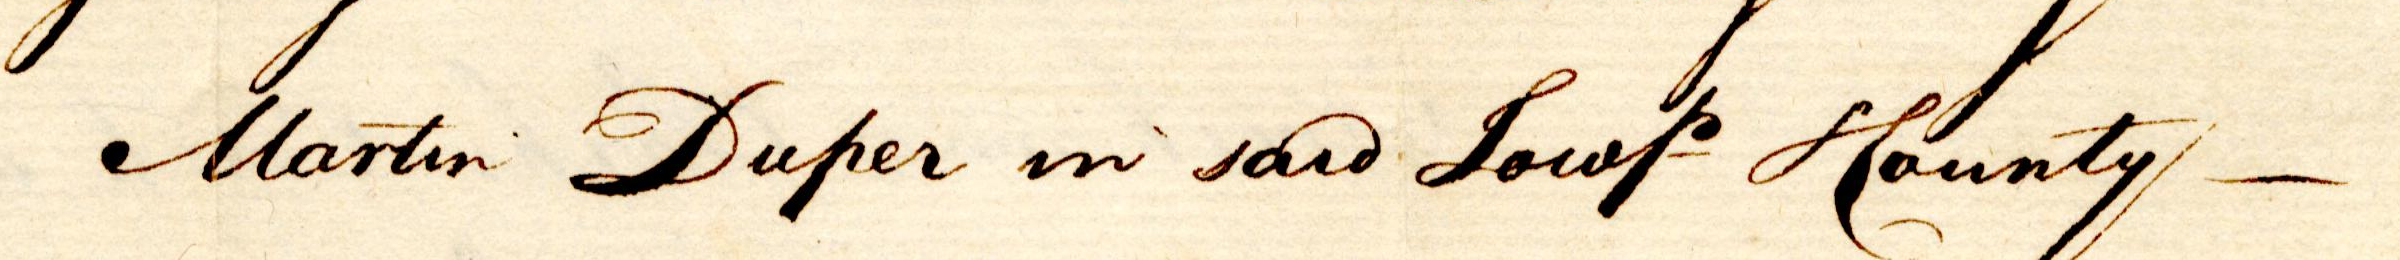Martin Duper in said Town^p. & County-
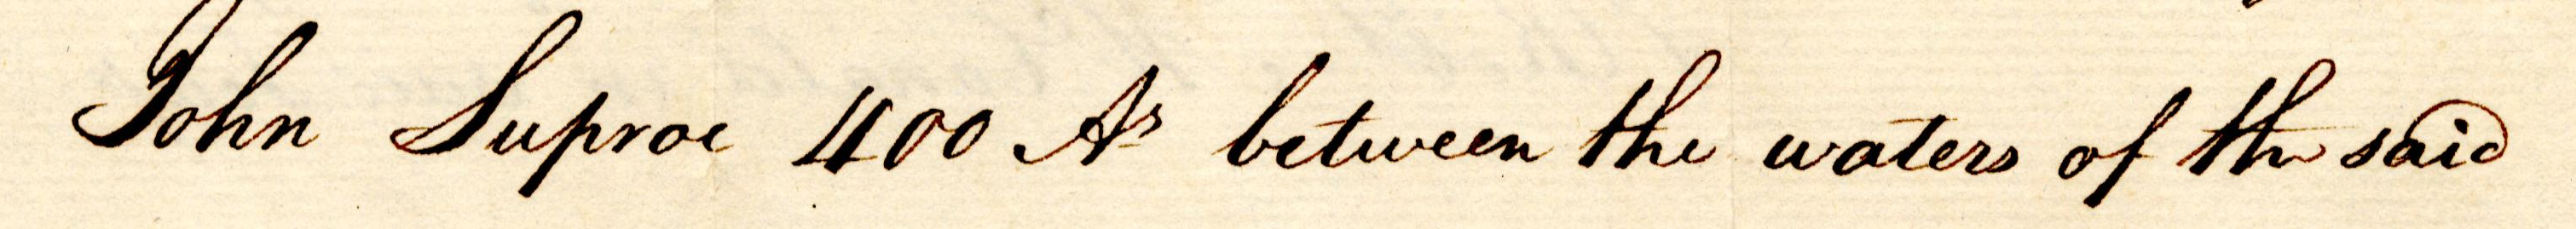John Suproe 400 A^s between the waters of the said
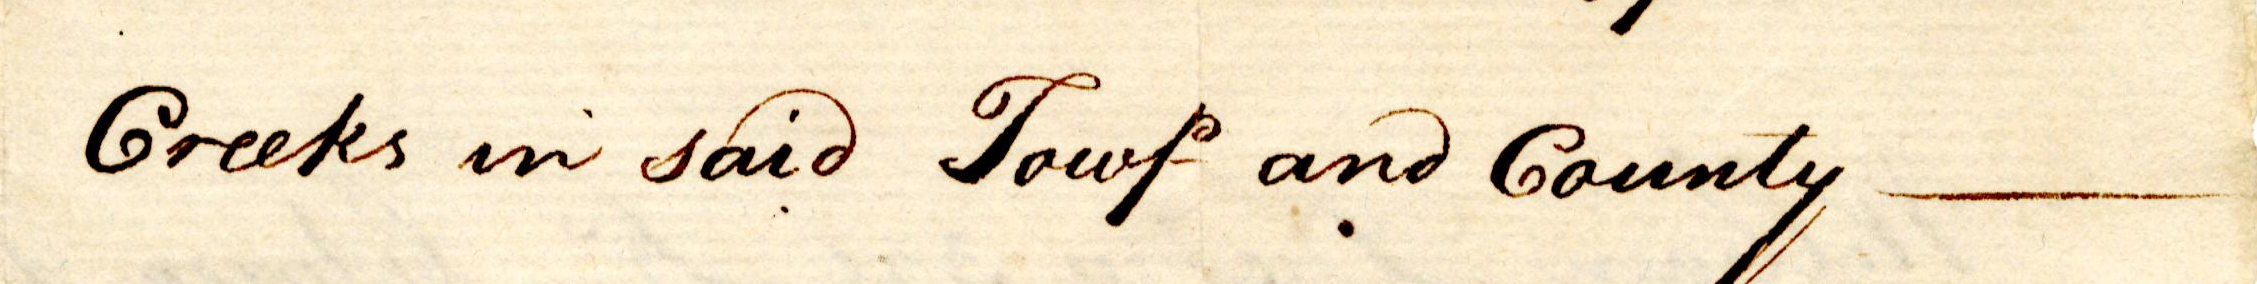Creeks in said Tow^p and County-
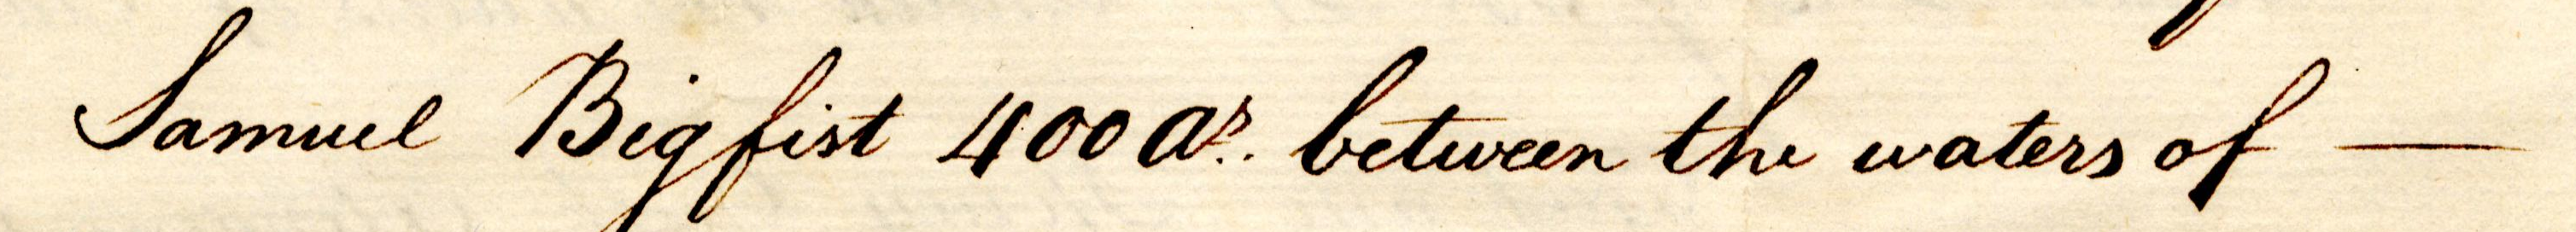Samuel Bigfist 400 A^s. between the waters of-
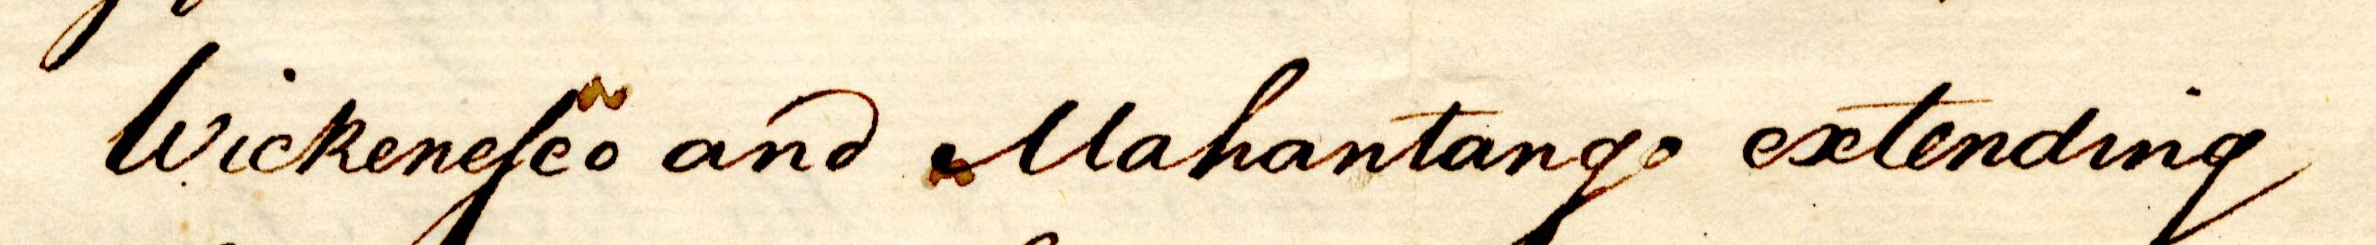Wickenesco and Mahantango extending
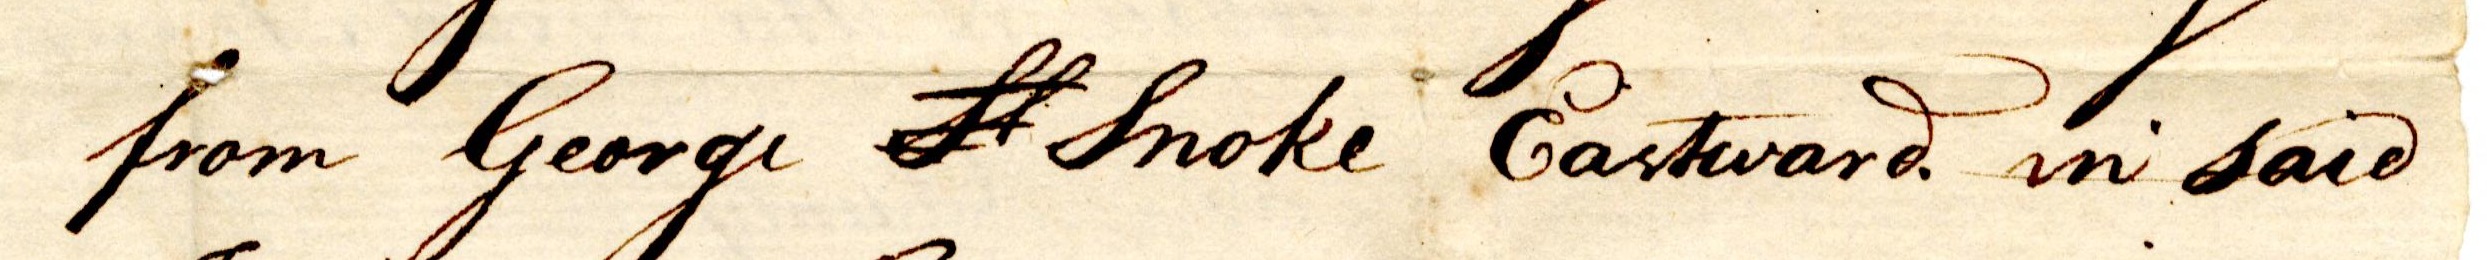from George [S^t] Snoke Castward in said
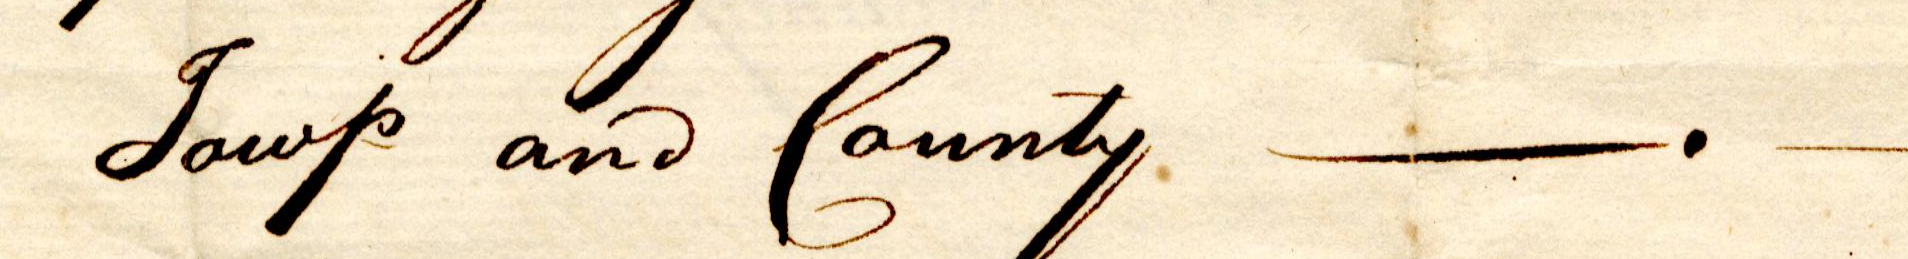Tow^p and County-.-
